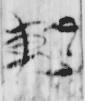○（範）
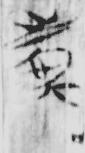慶
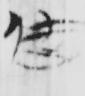○（屈）
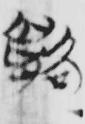○（貉）
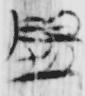○（陽）
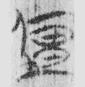疆
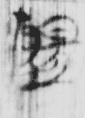○（陽）
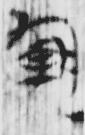軍
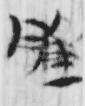○（陳）
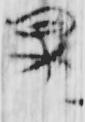果
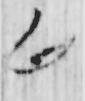㠯（以）
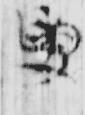受
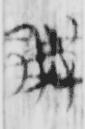○（許）
